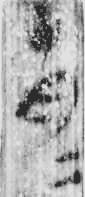殺
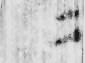亓（其）
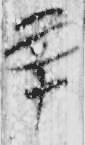○（兄）
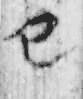巳
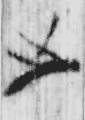之
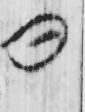日
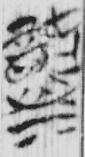○（遣）
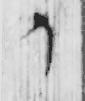人
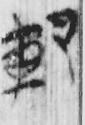○（範）
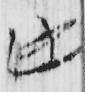臣
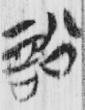訟
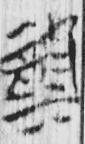○（遣）
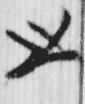之
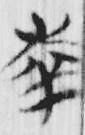南
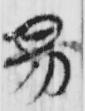昜（陽）
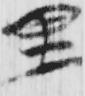里
